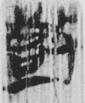鼓
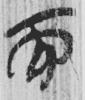而
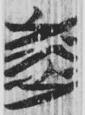涉
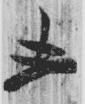之
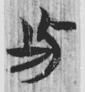此
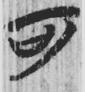可（何）
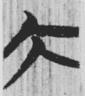大（太）
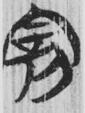○（宰）
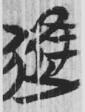進
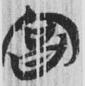○（答）
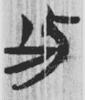此
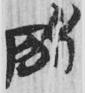所
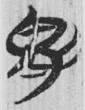{胃刀}（謂）
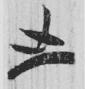之
